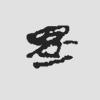是
